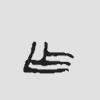乍
